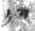北
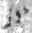之
